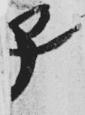子
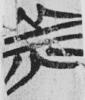羔
